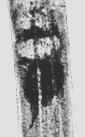而
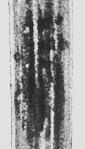而
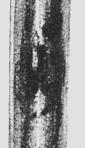臤（賢）
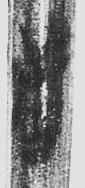者
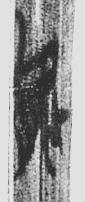能
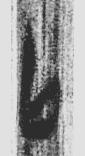㠯
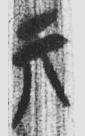亓
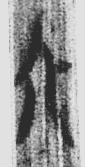六
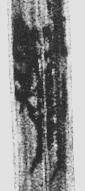{戕口貝}（藏）
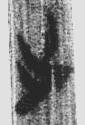之
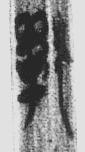獸（守）
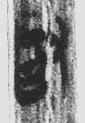取
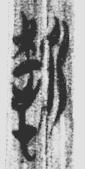新（新）
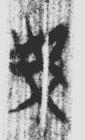𡚦（焉）
